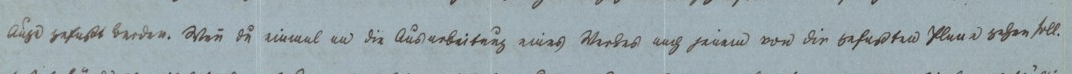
Auge gefaßt werden. Wenn du einmal an die Ausarbeitung eines Werkes nach jenem von dir gefaßten Plane gehen soll-
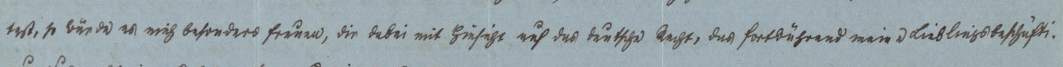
test, so würde es mich besonders freuen, dir dabei in Hinsicht auf das deutsche Recht, das fortwährend meine Lieblingsbeschäfti-
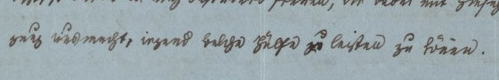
gung ausmacht, irgend welche Hülfe zu leisten zu können.
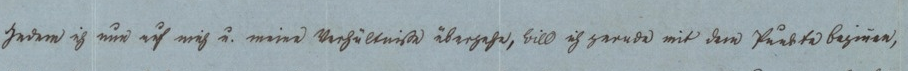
Indem ich nun auf mich u. meine Verhältnisse übergehe, will ich gerade mit dem Punkte beginnen,
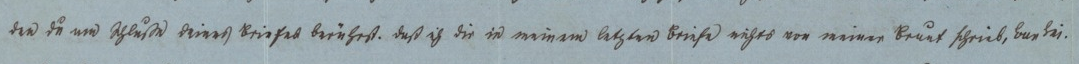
den du am Schlusse deines Briefes berührst. Daß ich dir in meinem letzten Briefe nichts von meiner Braut schrieb, war kei-
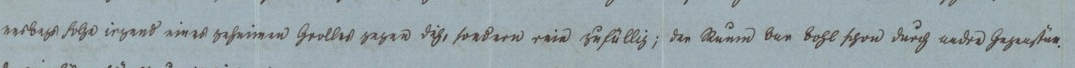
neswegs Folge irgend eines geheimen Grolles gegen dich, sondern rein zufällig; der Raum war wohl schon durch andre Gegenstän-
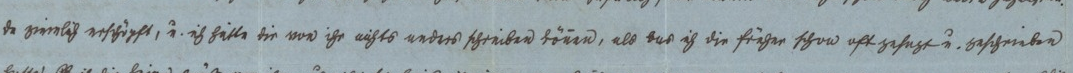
de ziemlich erschöpft, u. ich hätte dir von ihr nichts anders schreiben können, als was ich dir früher schon oft gesagt u. geschrieben
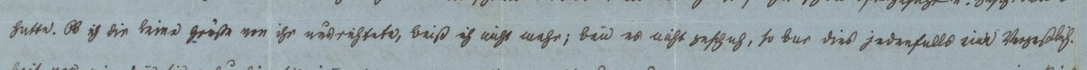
hatte. Ob ich dir keine Grüße von ihr ausrichtete, weiß ich nicht mehr; wenn es nicht geschah, so war dies jedenfalls eine Vergeßlich-
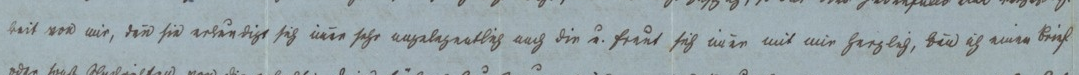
keit von mir, denn sie erkundigt sich immer sehr angelegentlich nach dir u. freut sich immer mit mir herzlich, wenn ich einen Brief
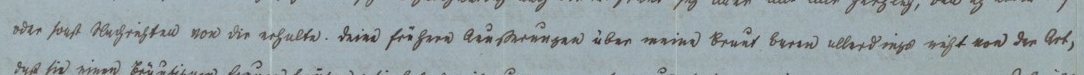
oder sonst Nachrichten von dir erhalte. Deine frühern Aeußerungen über meine Braut waren allerdings nicht von der Art,
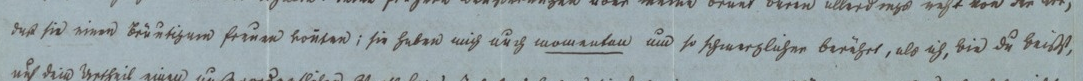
daß sie einen Bräutigam freuen konnten; sie haben mich auch momentan um so schmerzlicher berührt, als ich, wie du weißst,
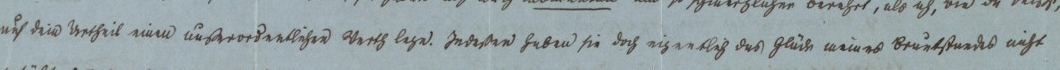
auf dein Urtheil einen außerordentlichen Werth lege. Indessen haben sie doch eigentlich das Glück meines Brautstandes nicht
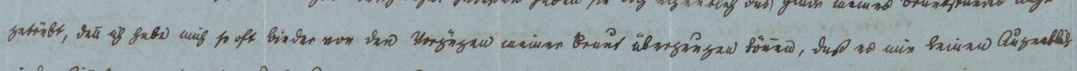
getrübt, denn ich habe mich so oft wieder von den Vorzügen meiner Braut überzeugen können, daß es mir keinen Augenblick
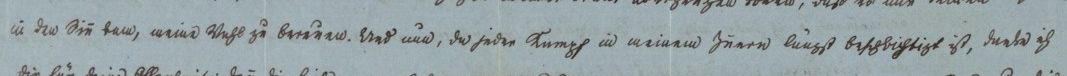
in den Sinn kam, meine Wahl zu bereuen. Und nun, da jeder Kampf in meinem Innern längst beschwichtigt ist, danke ich
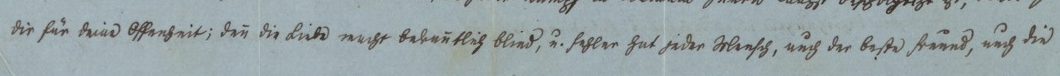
dir für deine Offenheit; denn die Liebe macht bekanntlich blind, u. Fehler hat jeder Mensch, auch der beste Freund, auch die
